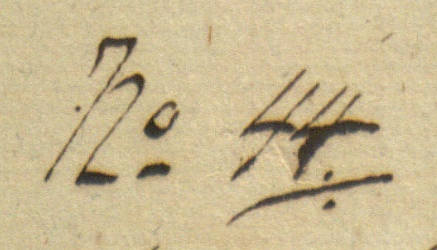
No 44.
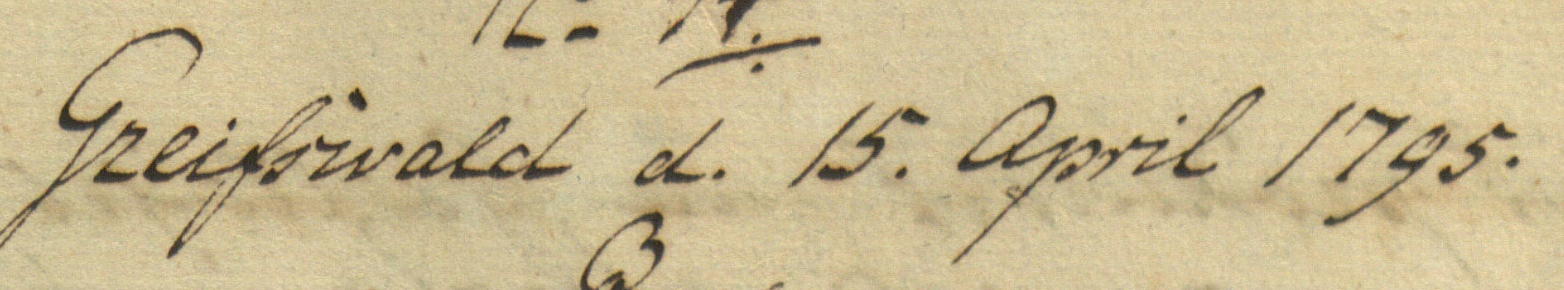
Greifswald d. 15. April 1795.
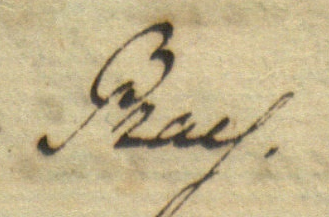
Praes.
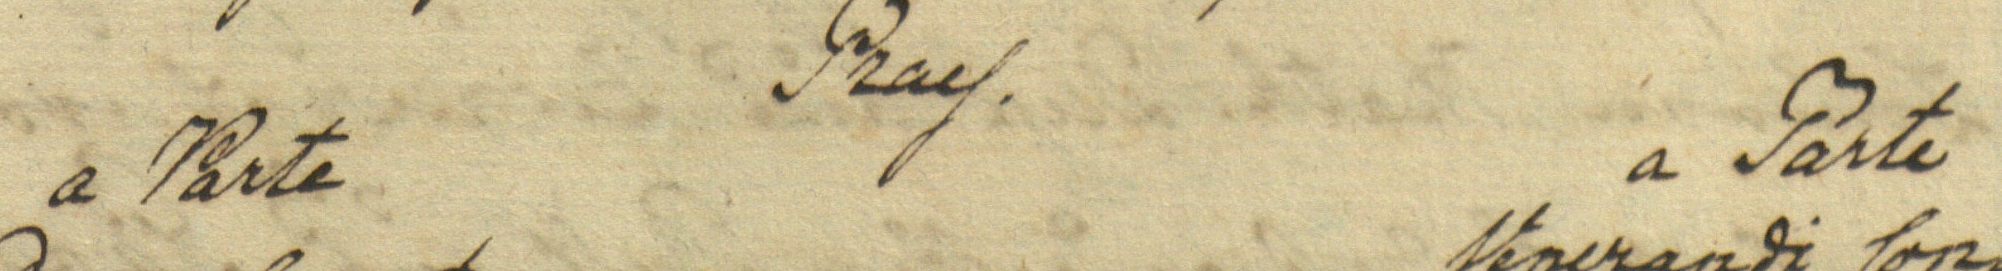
a Parte a Parte
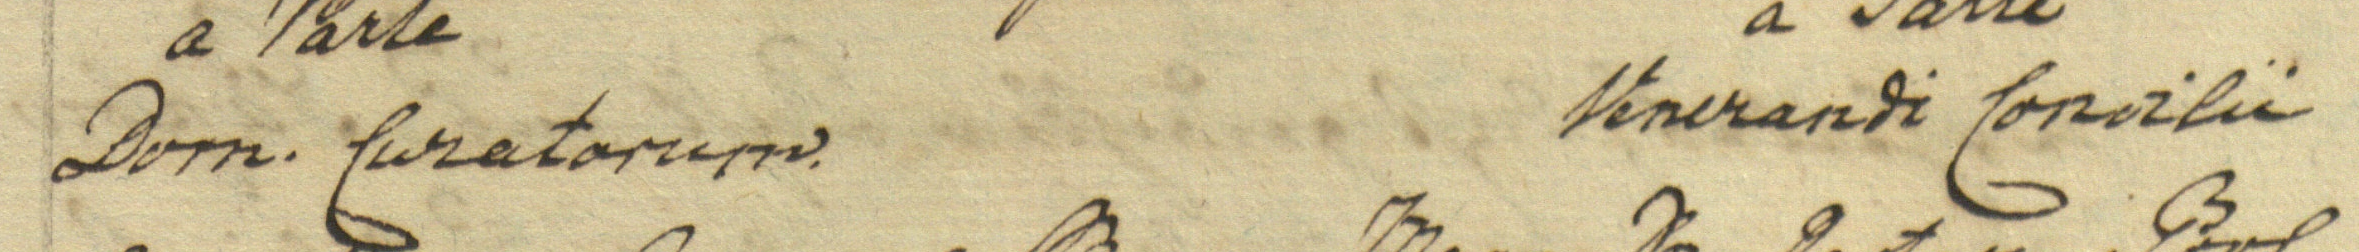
Dom. Curatorum. Venerandi Concilii
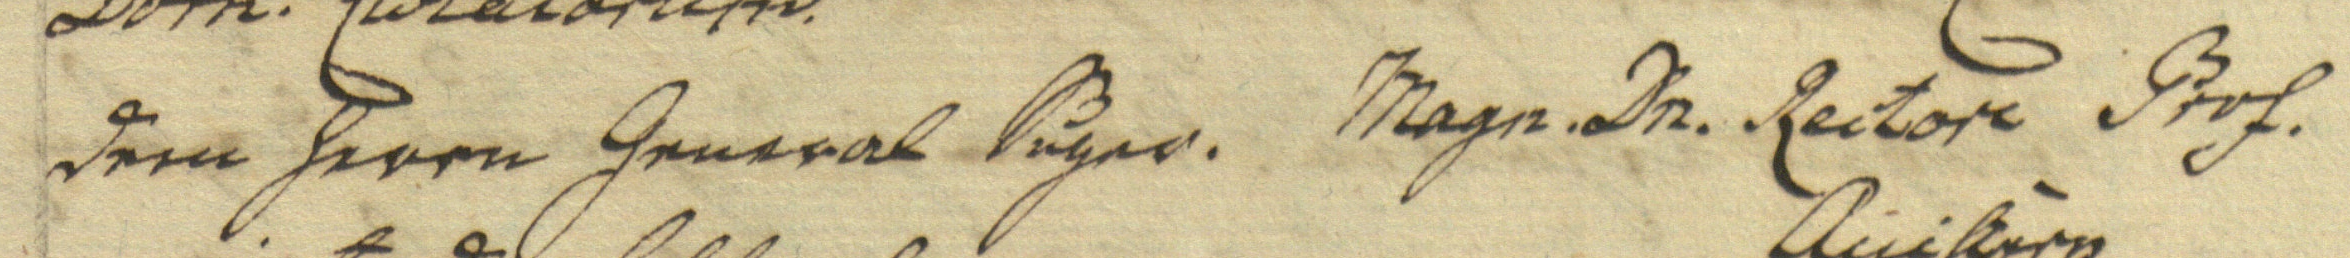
dem Herrn General Super¬ Magn. Dn. Rectore Prof.
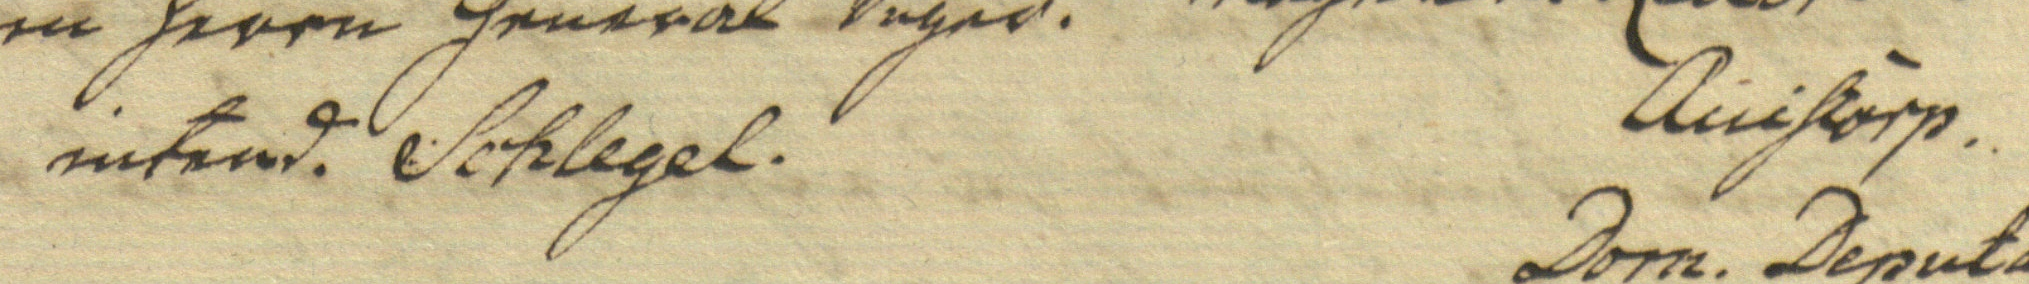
intend. Schlegel. Quistorp.
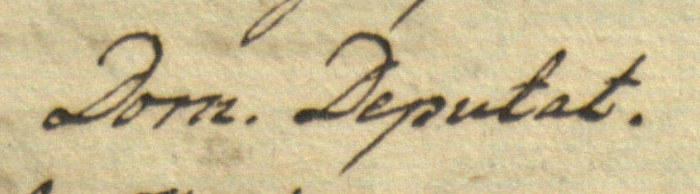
Dom. Deputat.
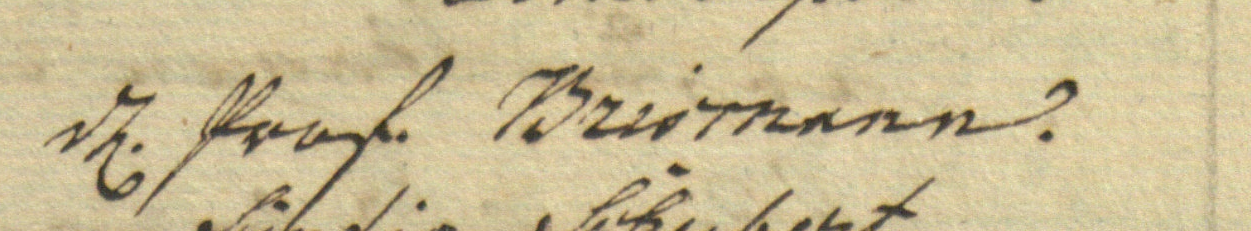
dh. Prof. Brismann.
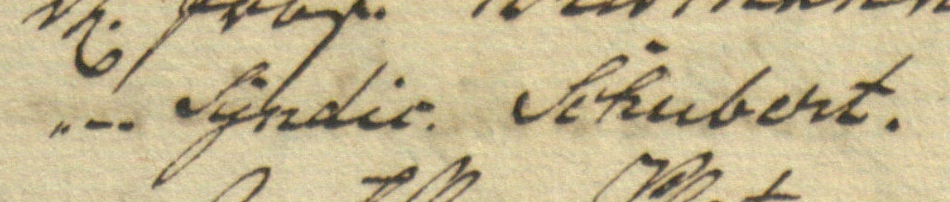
Sÿndic. Schubert.
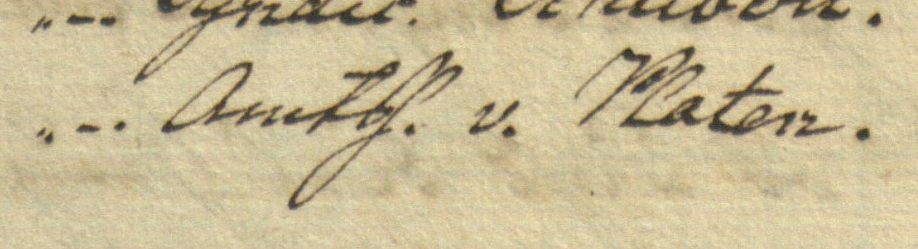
Amtsh. v. Platen.
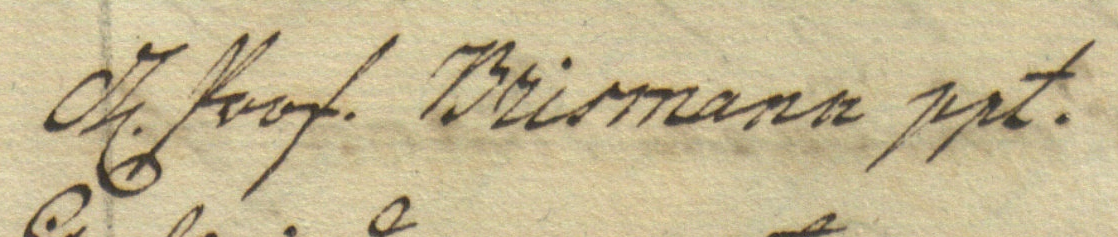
dh. Prof. Brismann ppt.
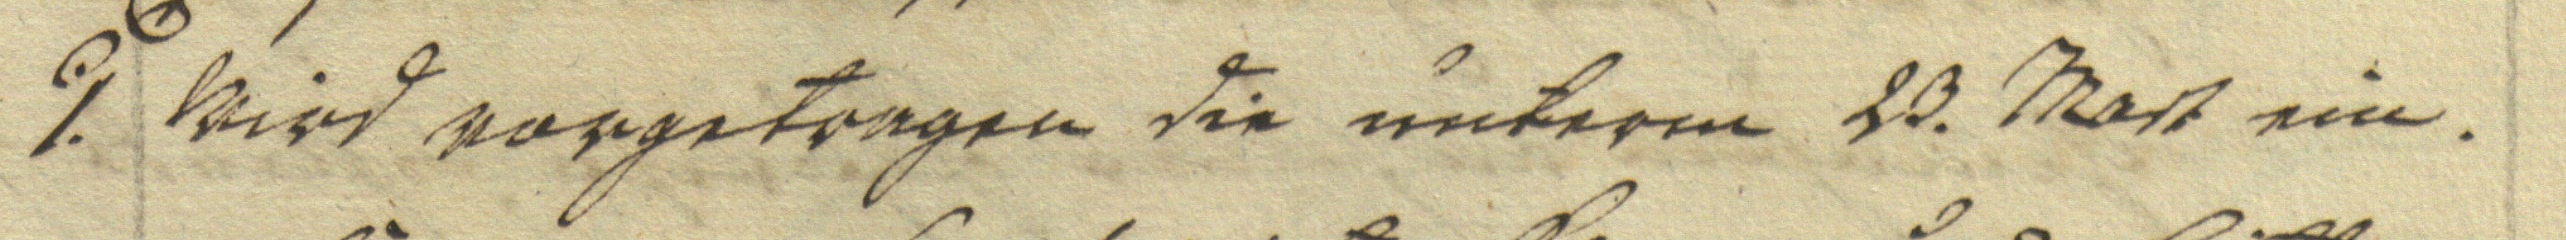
1. Wird vorgetragen die unterm 23. Mart ein¬
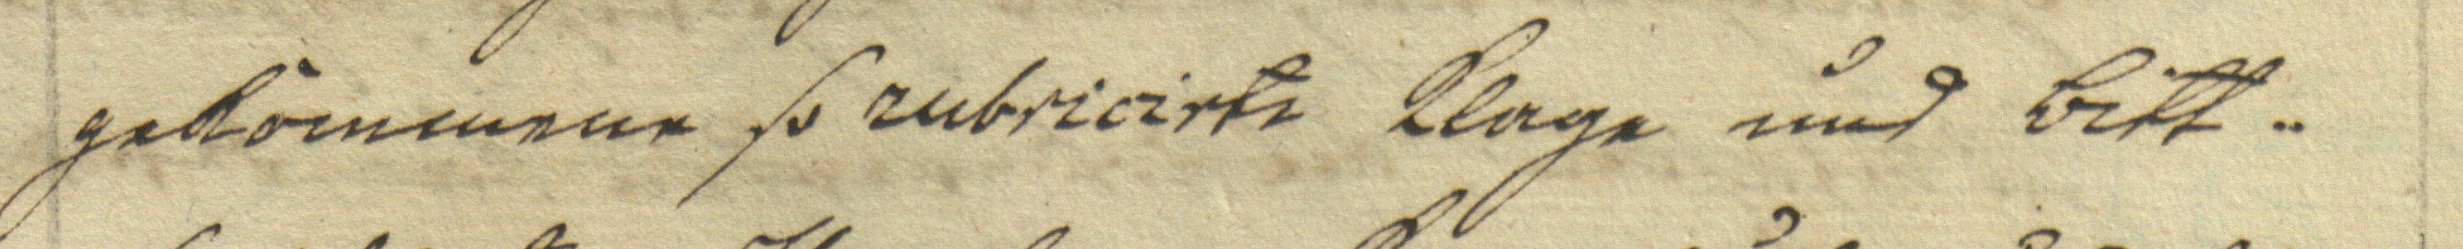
gekommene so rubricirte Klage und Bitt¬
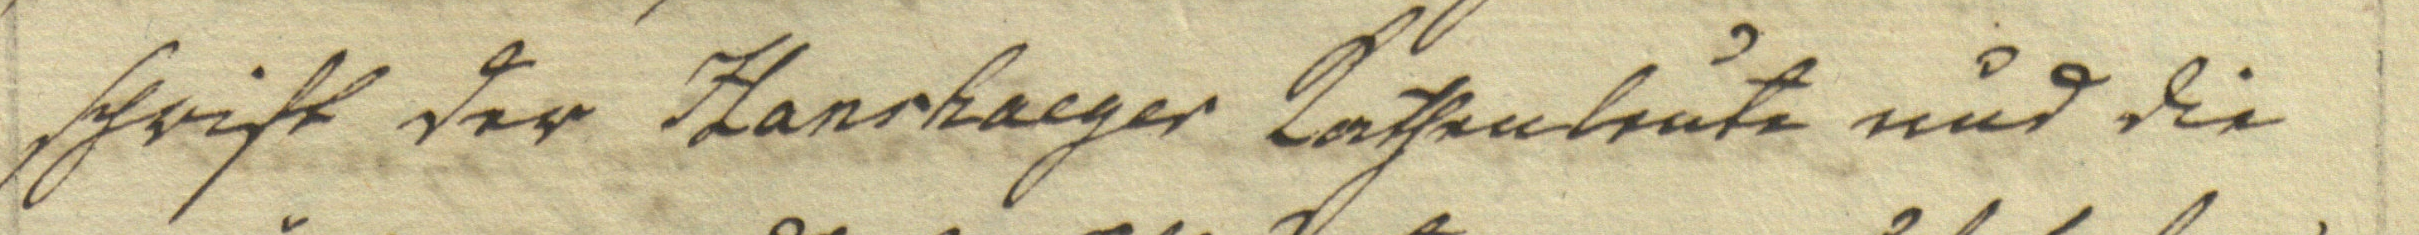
schrift der Hanshaeger Kathenleute und die
